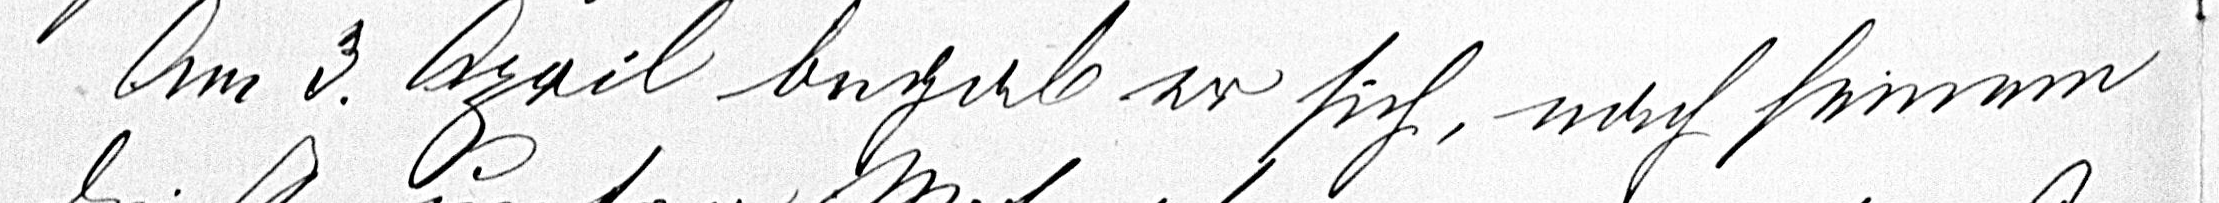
Am 3. April begab er sich, nach seinem
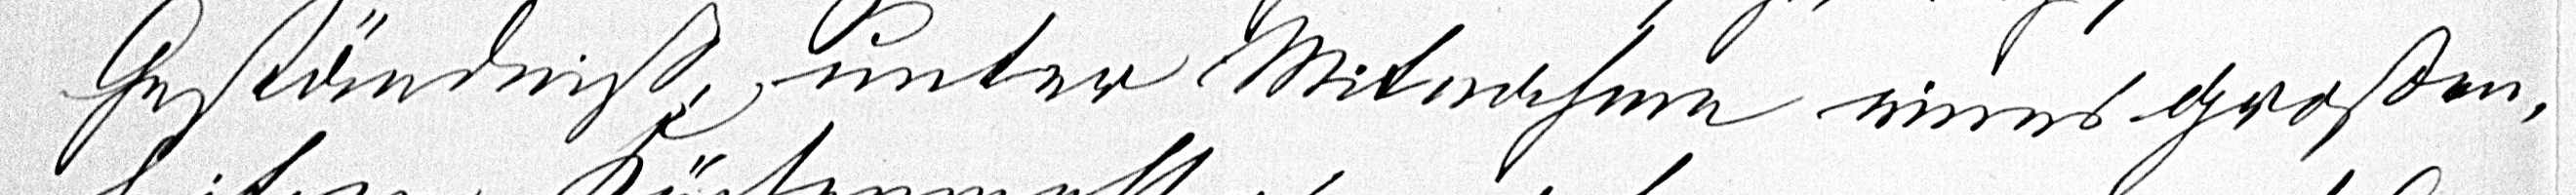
Geständniß, unter Mitnahme eines großen,
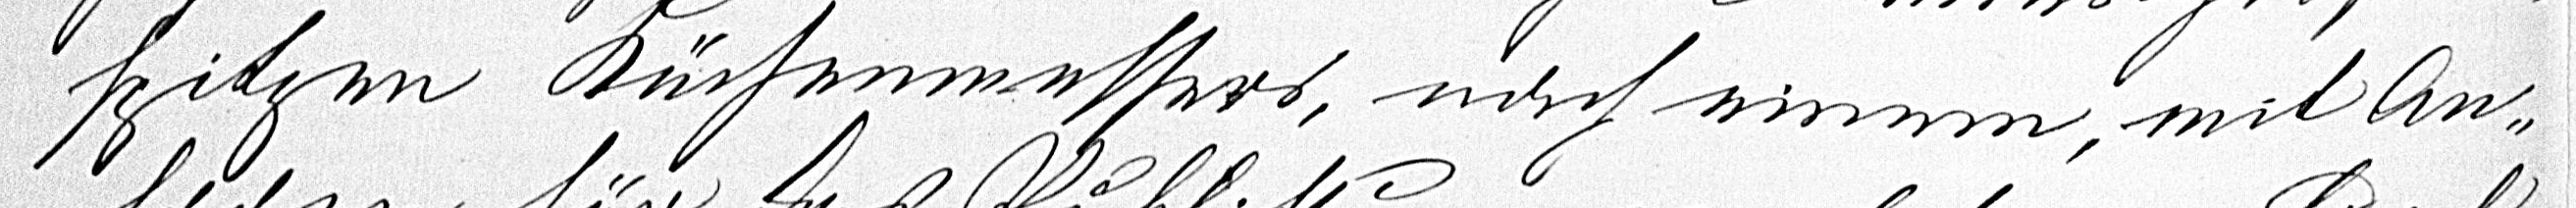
spitzen Küchenmessers, nach einem, mit An¬
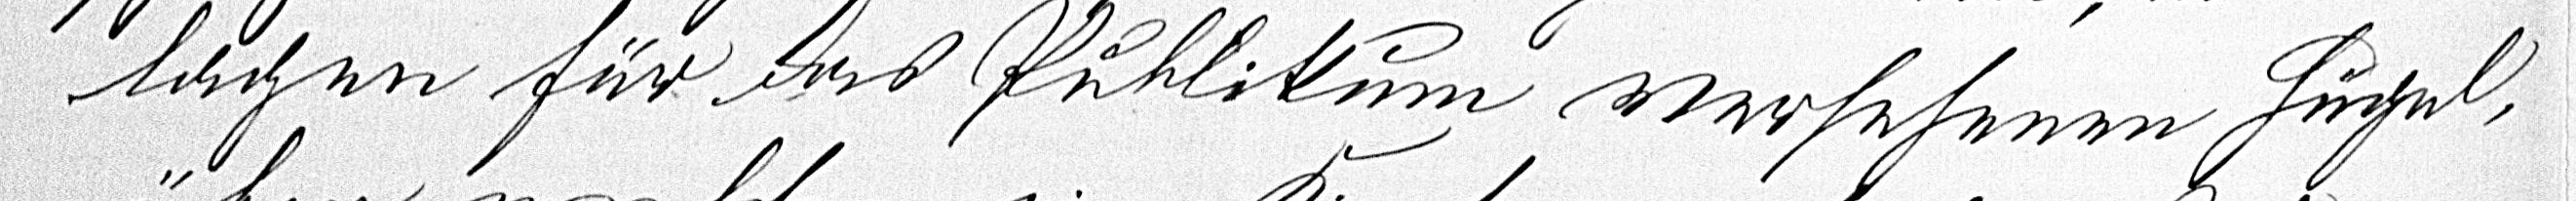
lagen für das Publikum versehenen Hugel,
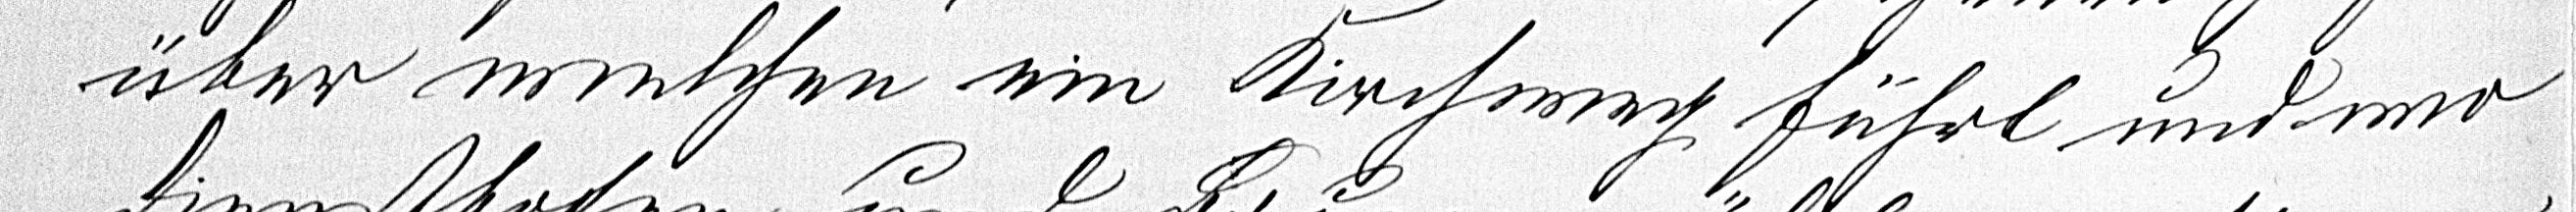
über welchen ein Kirchweg führt und wo
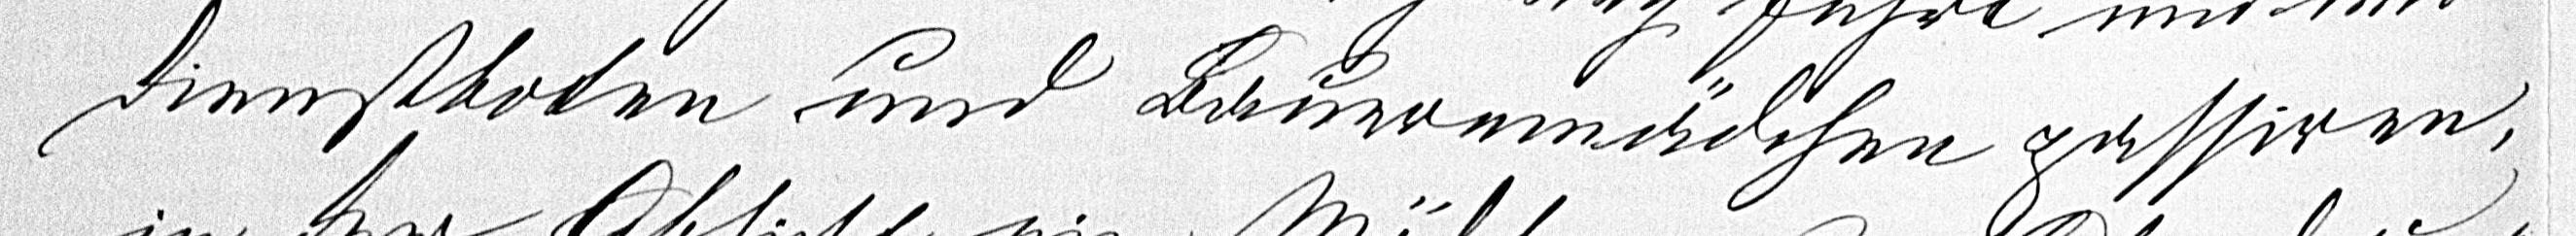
Dienstboten und Bauernmädchen passiren,
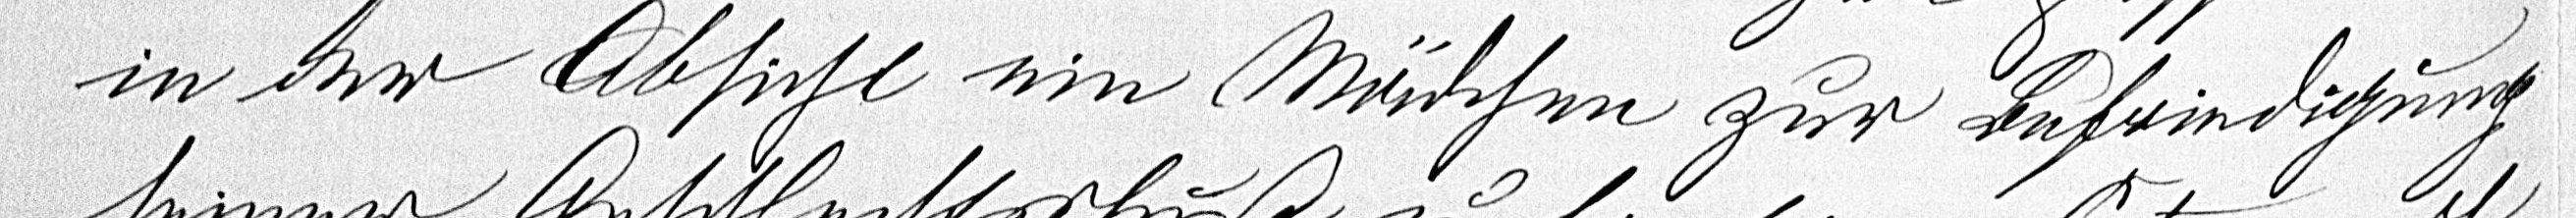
in der Absicht ein Mädchen zur Befriedigung
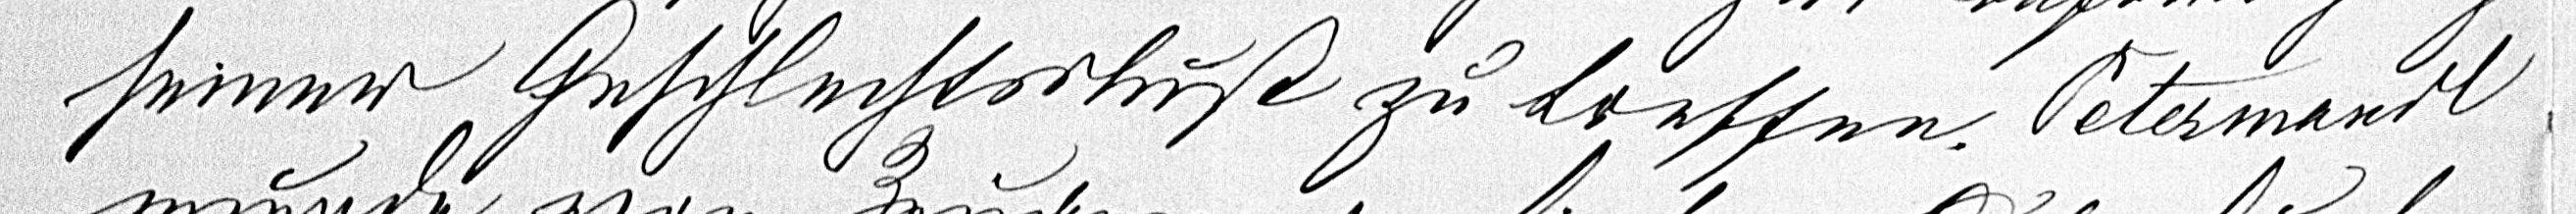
seiner Geschlechtsslust zu treffen. Petermandl
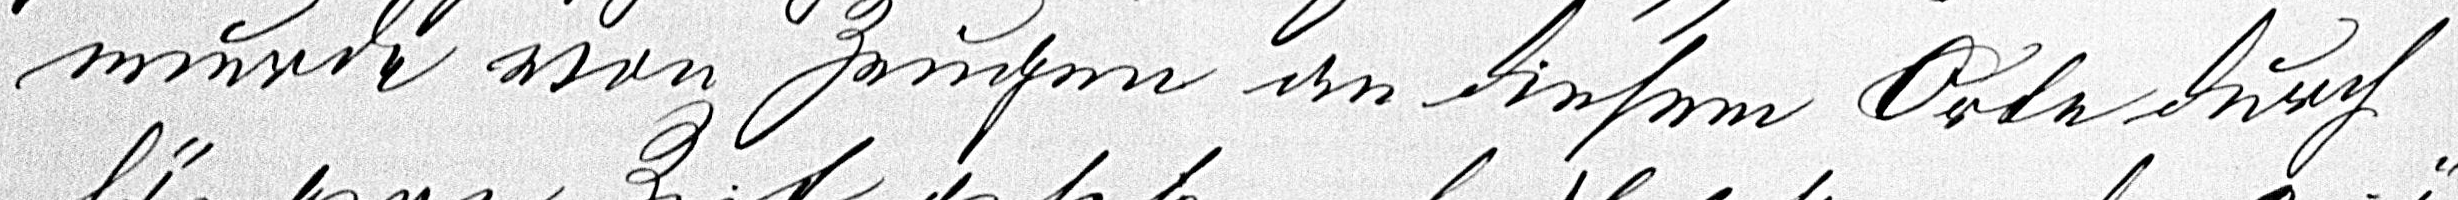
wurde von Zeugen an diesem Orte durch
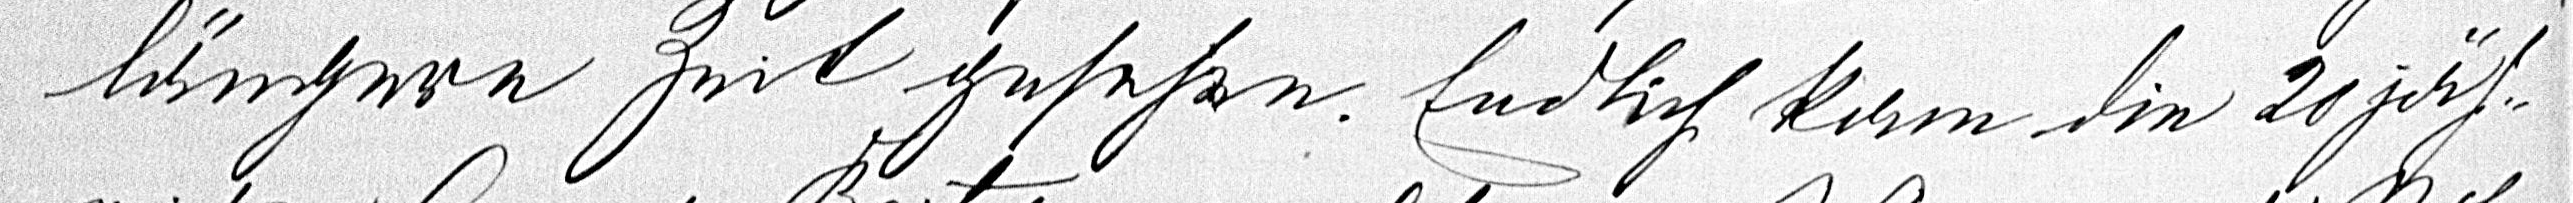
längere Zeit gesehen. Endlich kam die 20 jäh¬
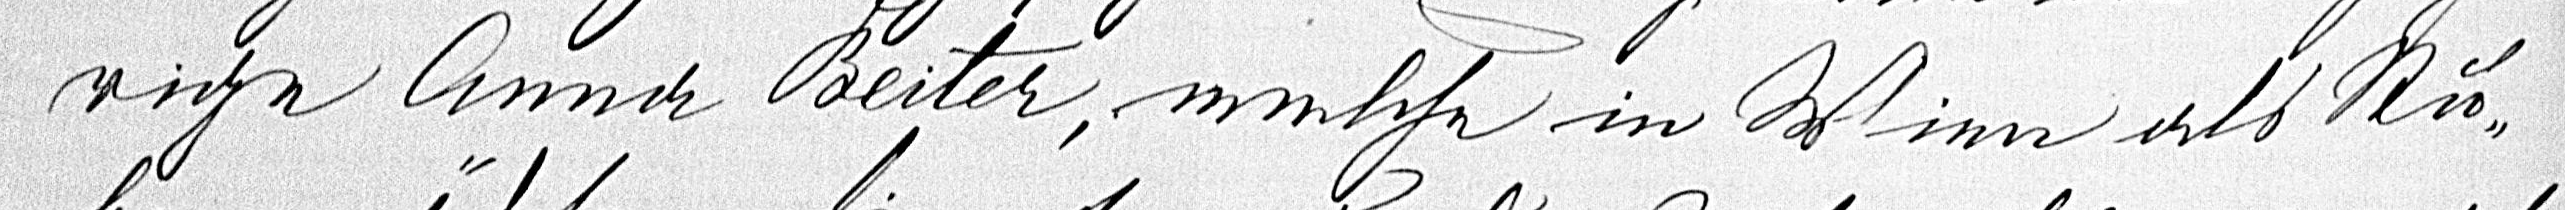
rige Anna Beiter, welche in Wien als Stu¬
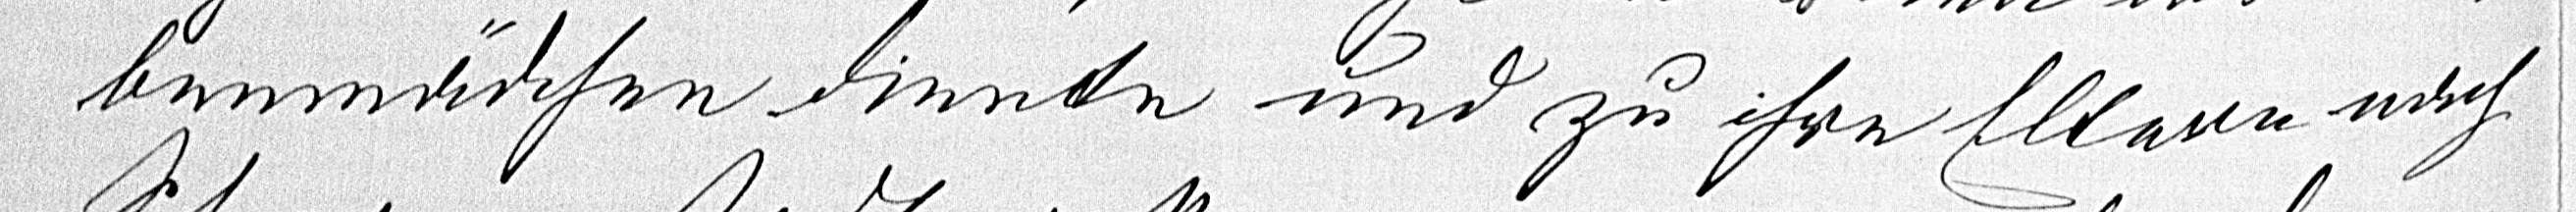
benmädchen Diente und zu ihre Eltern nach
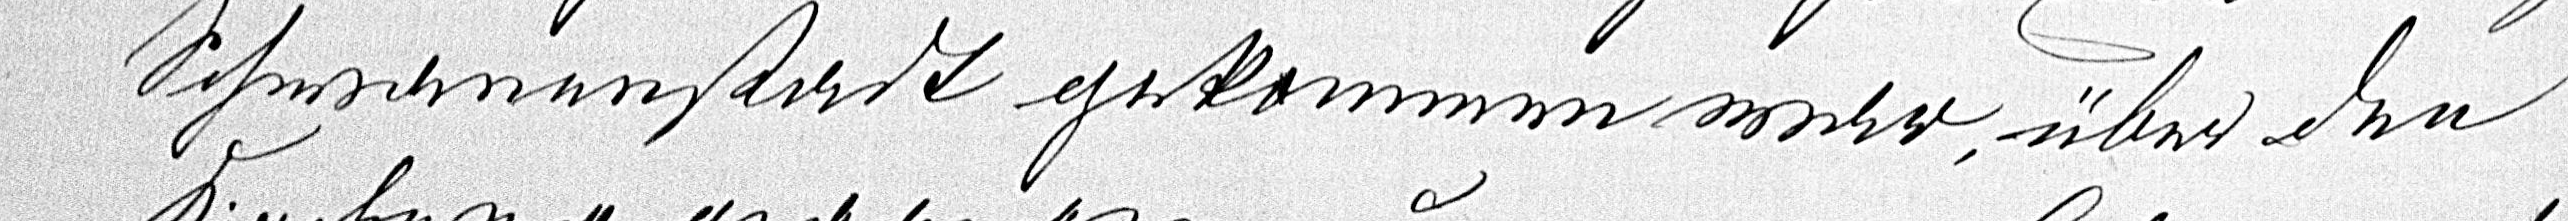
Schwanenstadt gekommen war, über den
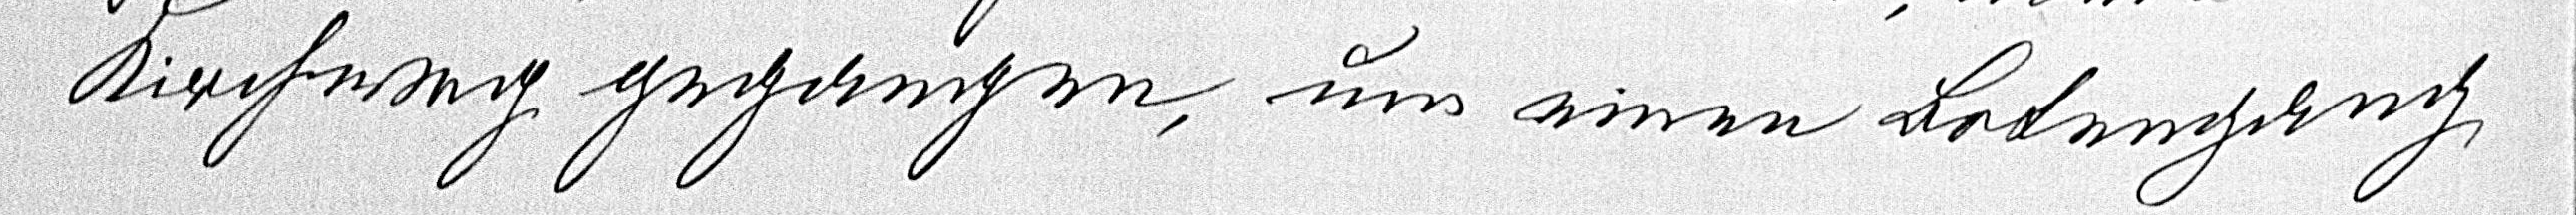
Kirchweg gegangen, um einen Botengang
